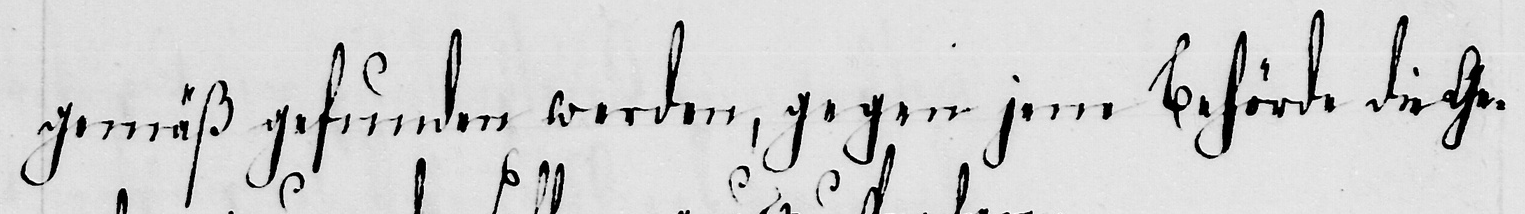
gemäß gefunden werden, gegen jene Behörde die Ge¬
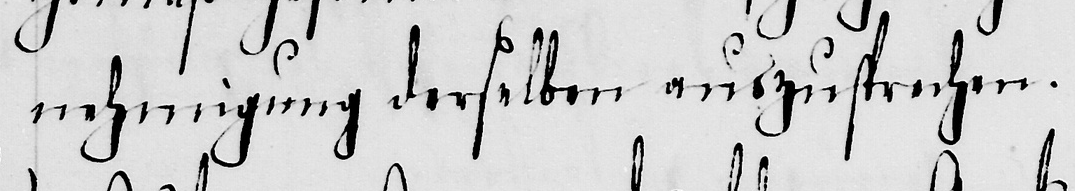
nehmigung derselben auszusprechen.
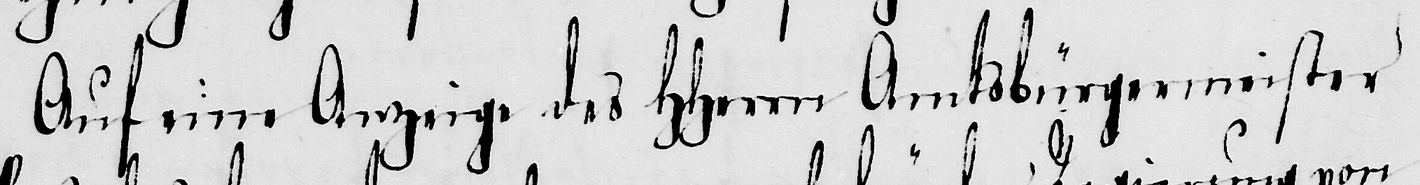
Auf eine Anzeige des HHerrn Amtsbürgermeister
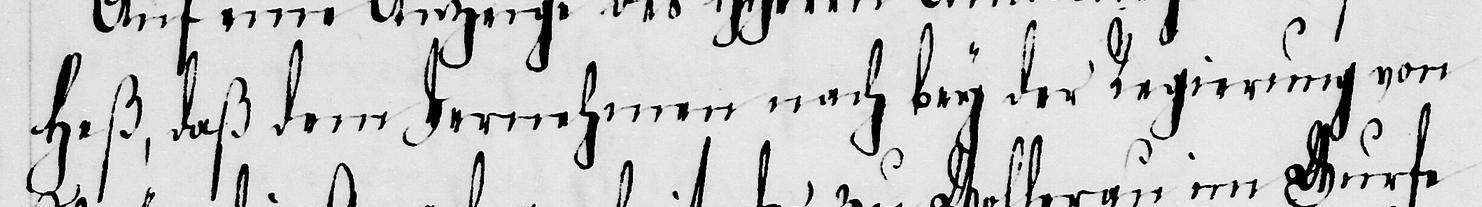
Heß, daß dem Vernehmen nach bey der Regierung von
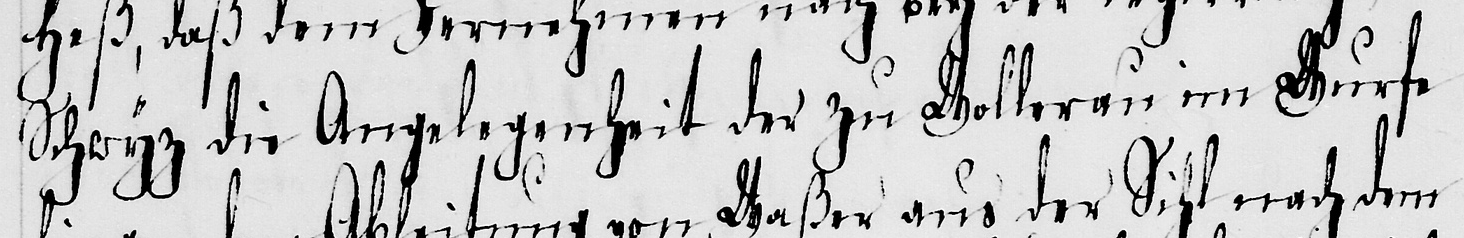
Schwyz die Angelegenheit der zu Wollerau im Wurfe
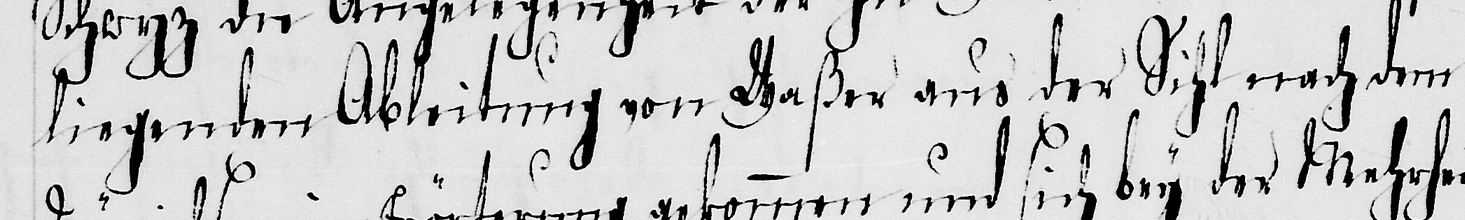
liegenden Ableitung von Waßer aus der Sihl nach dem
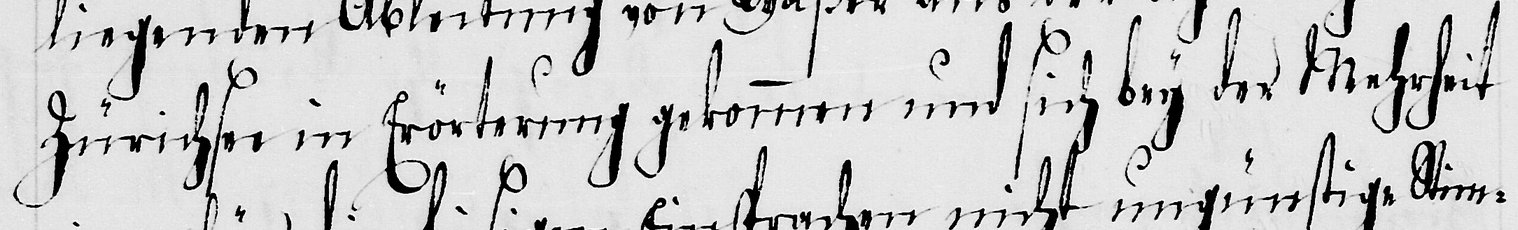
Zürichsee in Erörterung gekommen und sich bey der Mehrheit
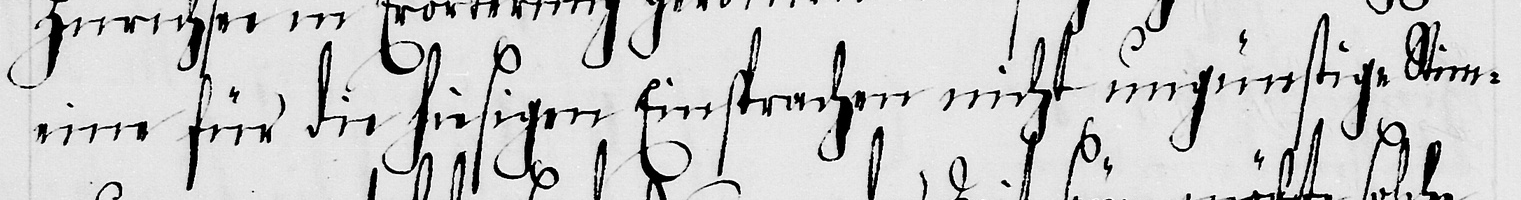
eine für die hiesige Einsprachen nicht ungünstige Stim¬
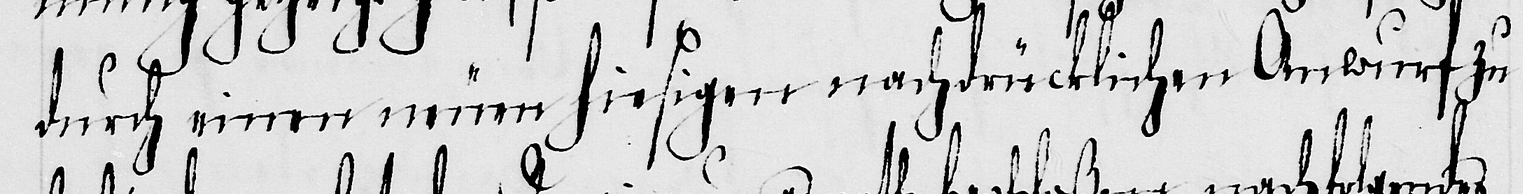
durch einen neuen hiesigen nachdrücklichen Anwurf zu
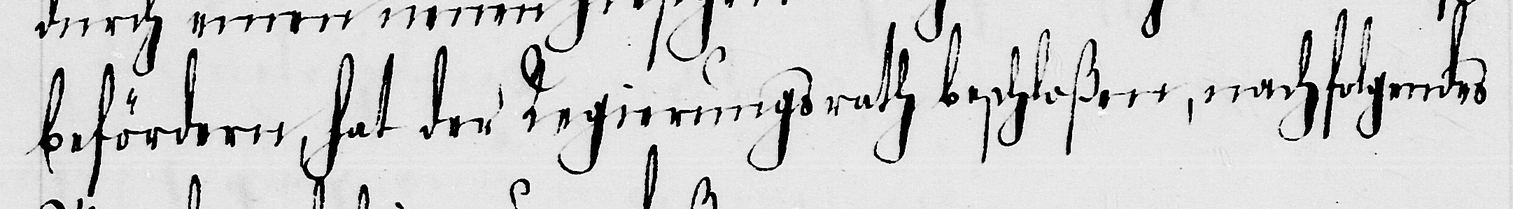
befördern, hat der Regierungsrath beschloßen, nachfolgendes
